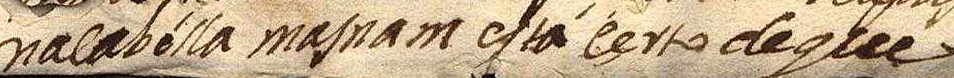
na cabessa mas nam está certo de que
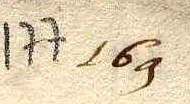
169
